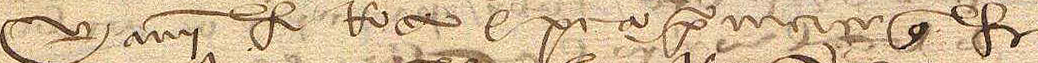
E a mj̄ lhe Rogo e peço p̄o merce q̄ lhe
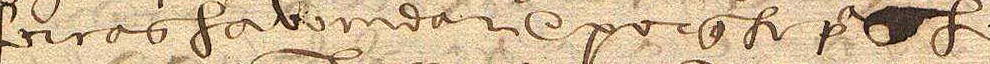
forças havomdar e porq̄ he pa q̄ ho
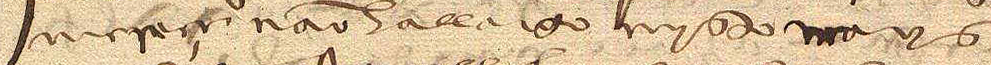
merece não hallargo nysto mays
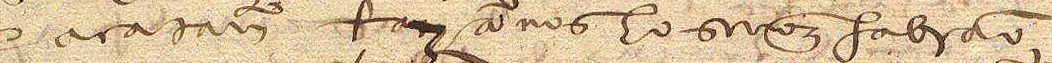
e acatamto faz c̄o nos ho senōr habraõ
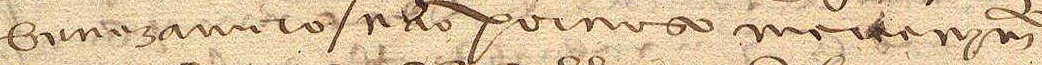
benezamero / naõ por noso merecymto
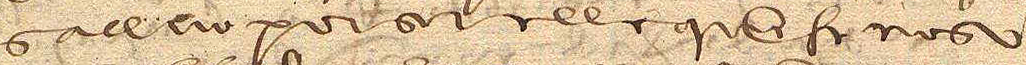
salluo por ser elle quē he noso
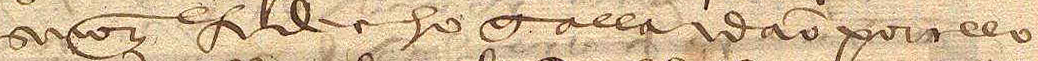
senōr lhe dee ho gallardaõ por ello
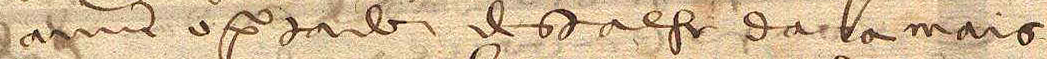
amē o p̄otador desta lhe dara mais
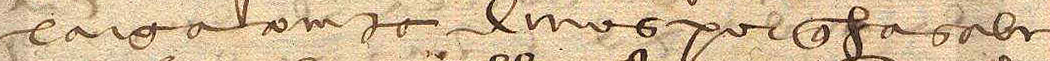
larga comta de nos porq̄ ha sabe
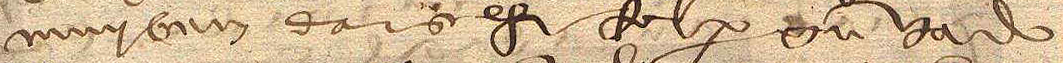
muy bem dar se lhe for ꝑgūtado
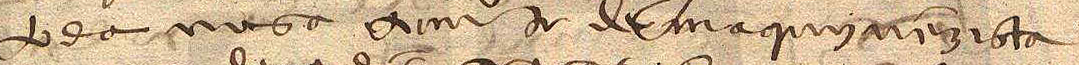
toda nosa tem te de maquynez esta
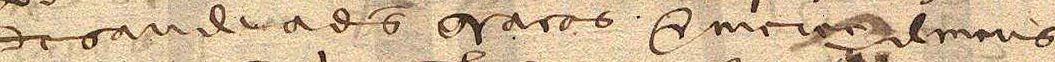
de saude a ds̄ gracas ē merce de meus
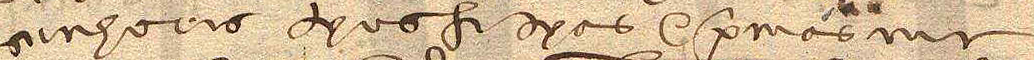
senhores tyos he tyas e p̄imas me
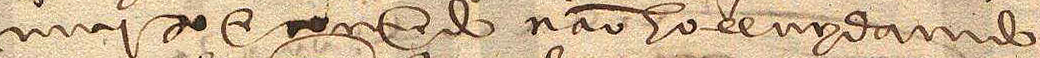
mujto ēcomēdo não holluydamdo
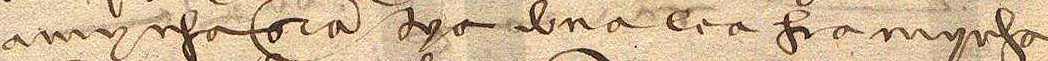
a mynha s̄ra tya dona lea he a mynha
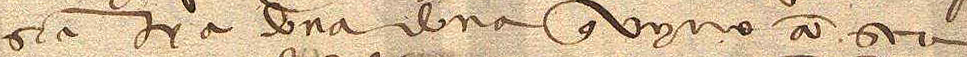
srā tya dona dona q̄ vyuo c̄o seu
